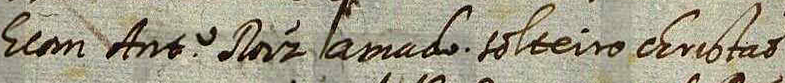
E com Ant.o Roiz̄ amado solteiro christaõ
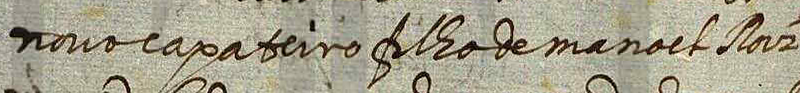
nouo capateiro filho de manoel Roiz̄
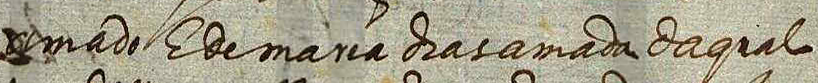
amado E de maria dias amada da qual
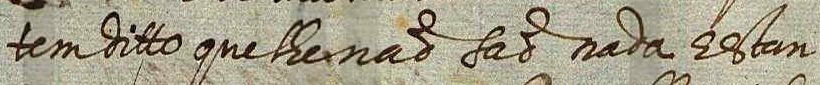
tem ditto que lhe naõ saõ nada E estan
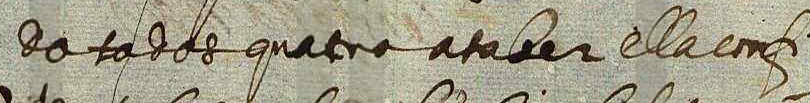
do todos quatro a saber ella confi
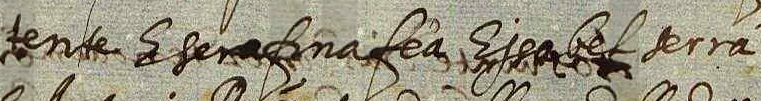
tente E serafina fea, E jsabel serrā
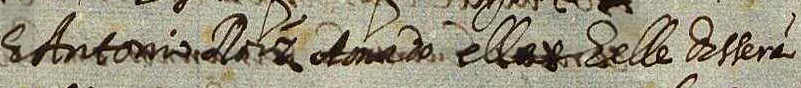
E Antonio Roiz̄ Amado ellas E elle disserā
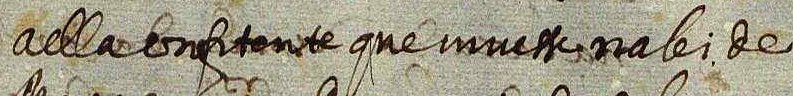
a ella confitente que uiuesse na lei de
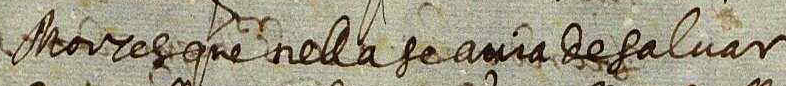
Moizes que nella se auia de saluar
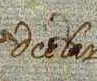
declar
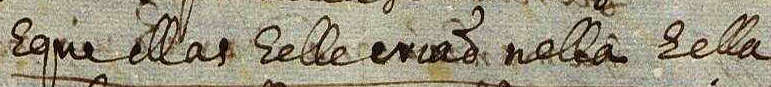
E que ellas E elle criaõ nella E ella
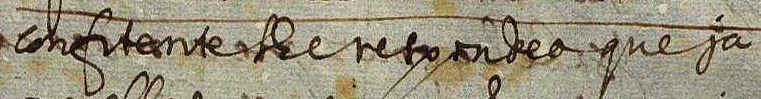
confitente lhe respondeo que ja
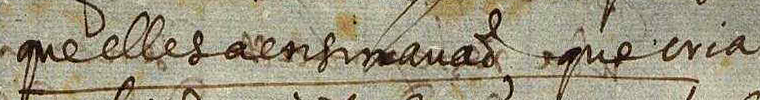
que elles a ensinauaõ que cria
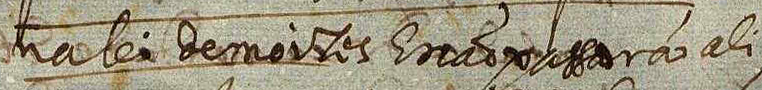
na lei de moizes E naõ passaraõ ali
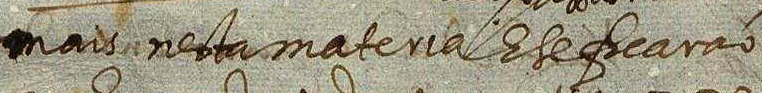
mais nesta materia E se ficarão
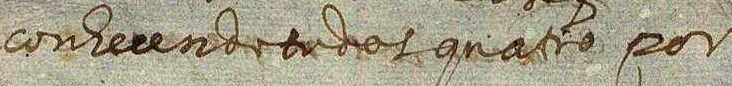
conhecendo todos quatro por
